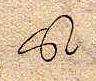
R
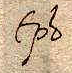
tpō
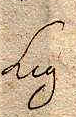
Lug
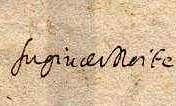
fugiu de noite
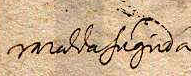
razaõ da fugida
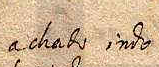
achado indo
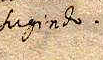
fugindo.
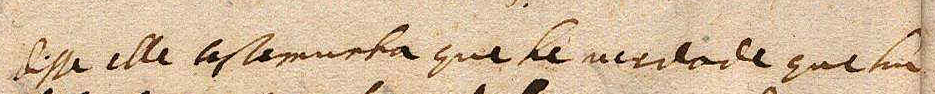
disse elle testemunha que he uerdade que hū
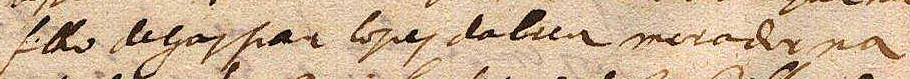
filho de gaspar lopes dabreu morador na
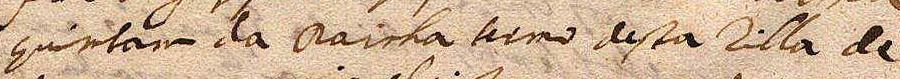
quintam da Rainha termo desta Villa de
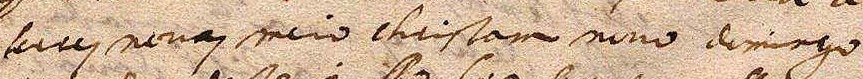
torres nouas meio christam nouo domingo
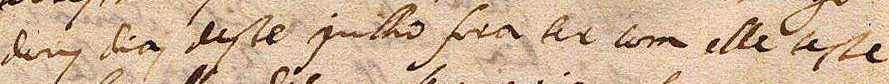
dous dias deste julho fora ter com elle teste
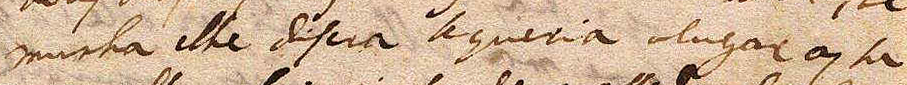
munha e lhe disera se queria alugar as su
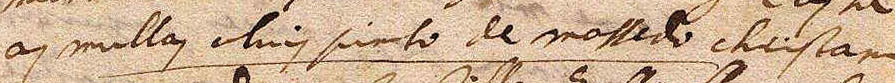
as mullas e luis pinho de massedo christam
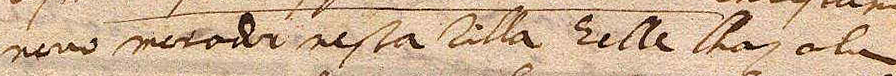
nouo morador nesta villa E elle lhas alu
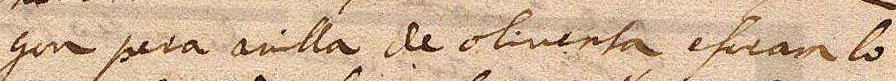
gou pera a villa de oliuensa e foram lo
